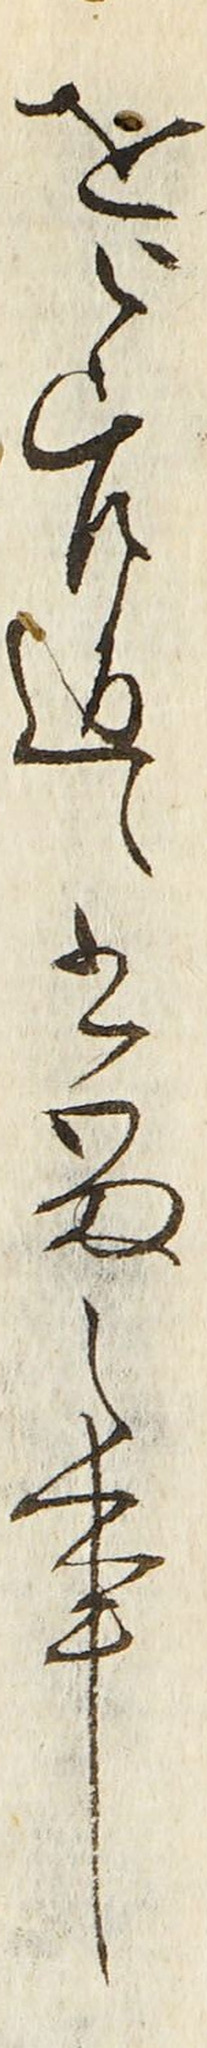を被差返候書留之事
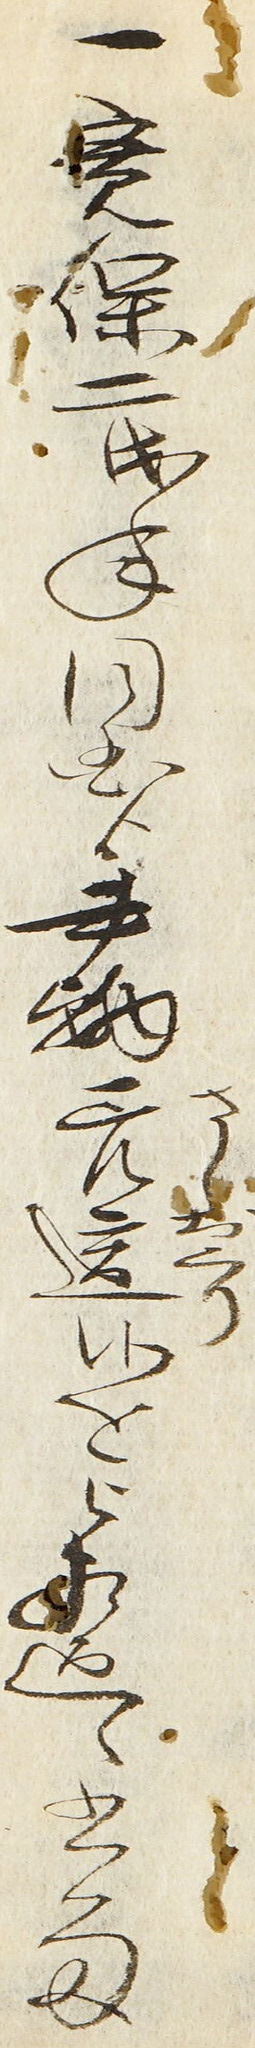一寛保二戌年同国より書翰差送候を被相返候書留
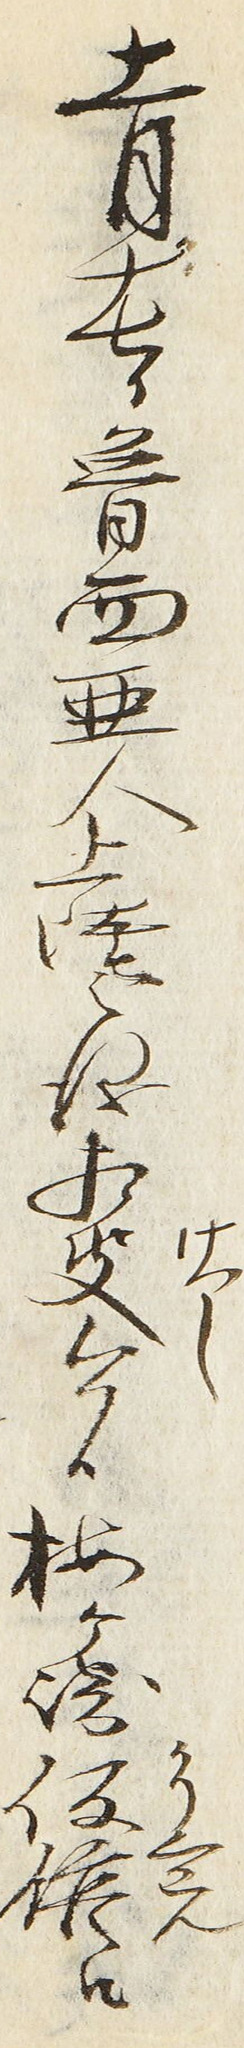十一月十七日魯西亜人上陸之儀相決今日梅ヶ崎仮館え
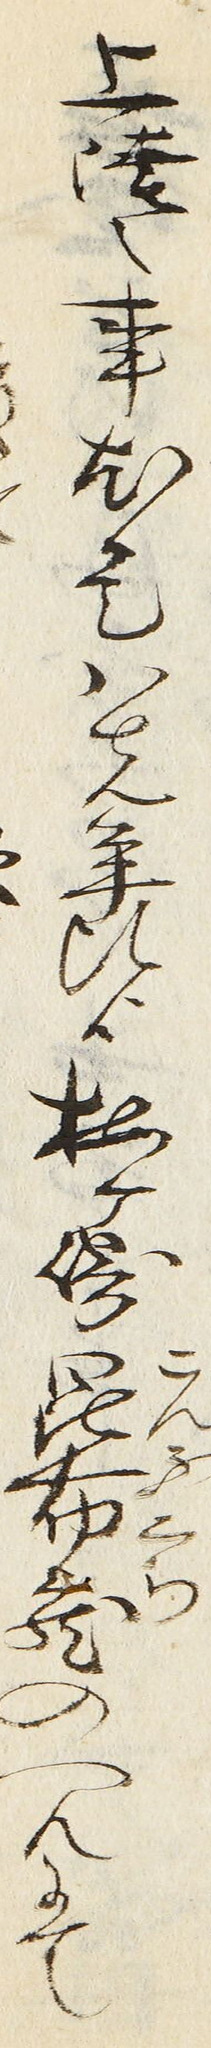上陸之事尤是は先年頃より梅ヶ崎昆布蔵のへんにて
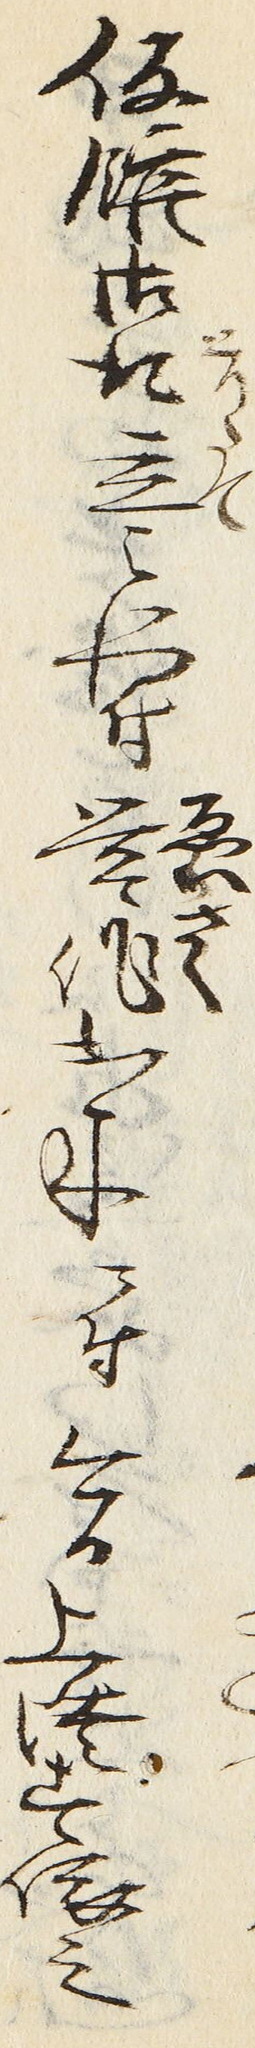仮館御取立被仰付営作出来に付今日上陸す依之
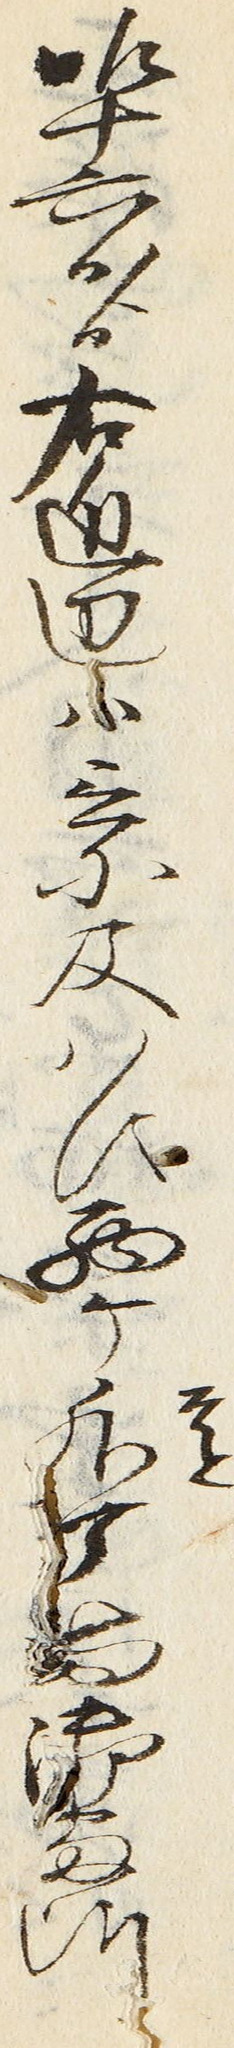明十六日より右近辺に云に及はす西町外町両御番所
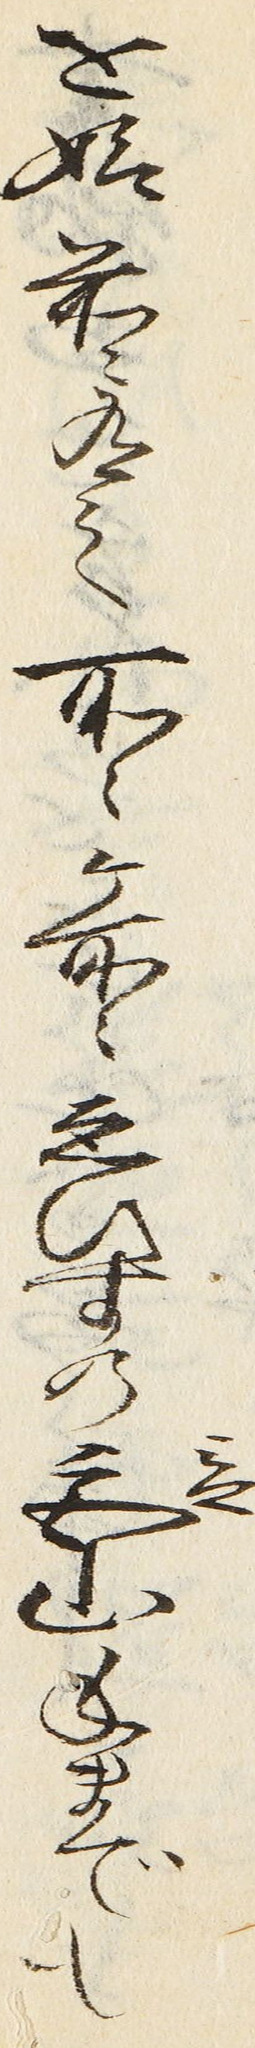を始前々有之所々ヶ所之ゑひすの宮山もまでも
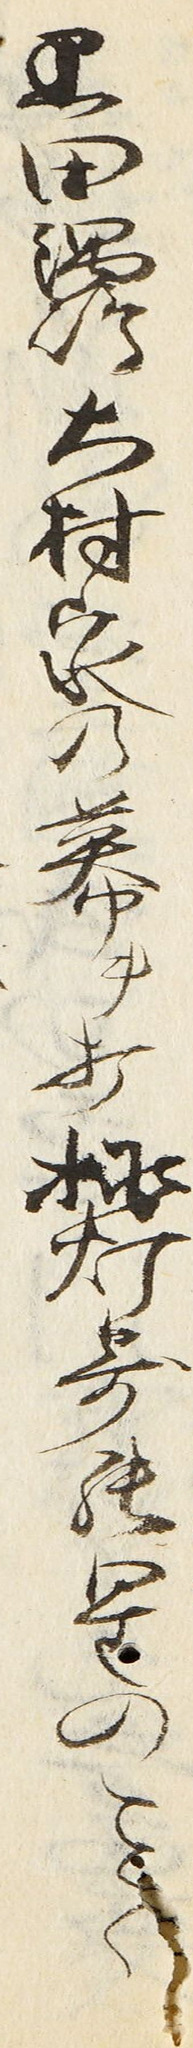黒田鍋島大村家の幕を打挑灯奇羅星のことく
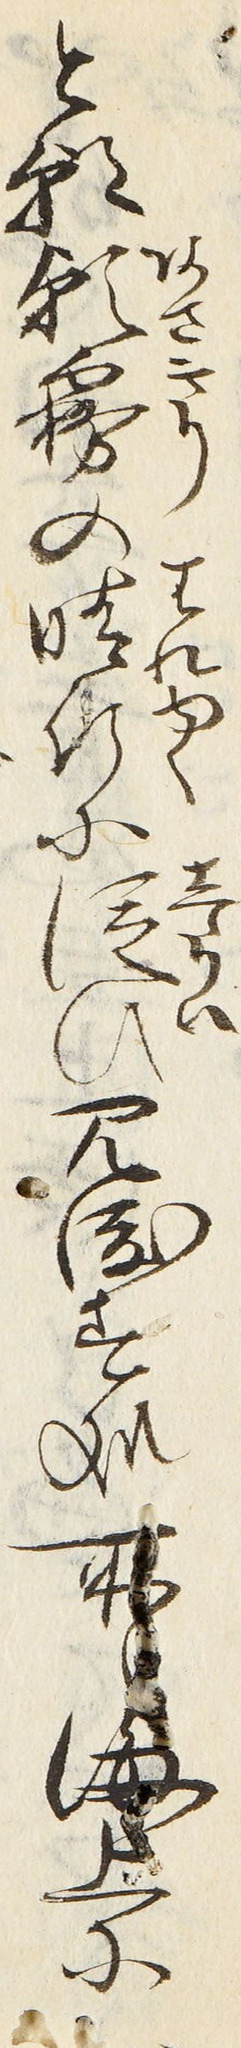今朝朝霧の晴行に従ひ見渡す処所々海上に
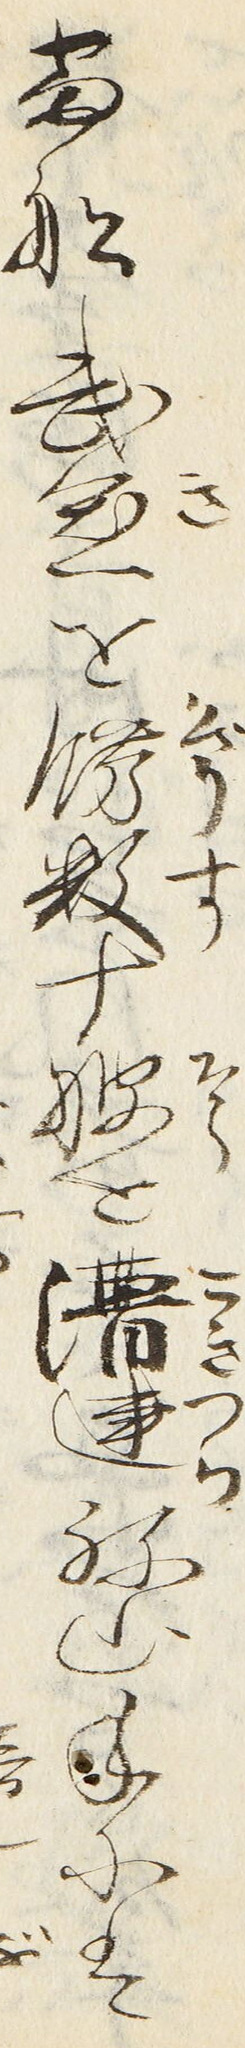番船武器を餝数十艘を漕連ね山手には
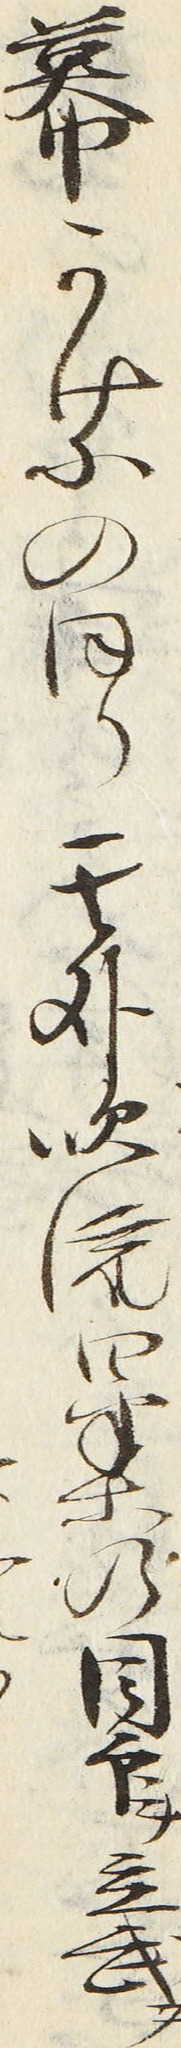幕かけにのほり其外吹流四半等の目印を立武を
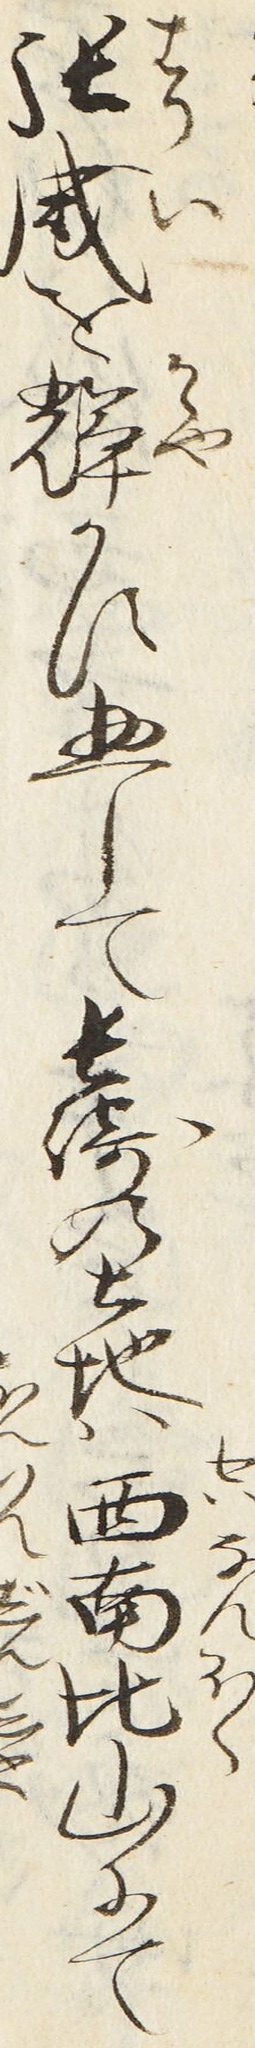張威を輝かす惣して長崎の土地は西南北山にて
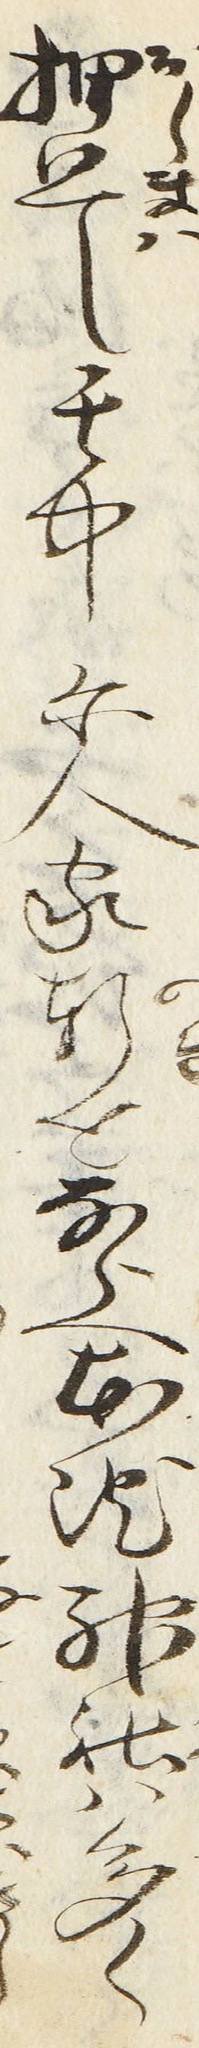押廻し其中に人家軒をならへ本院神社は多く
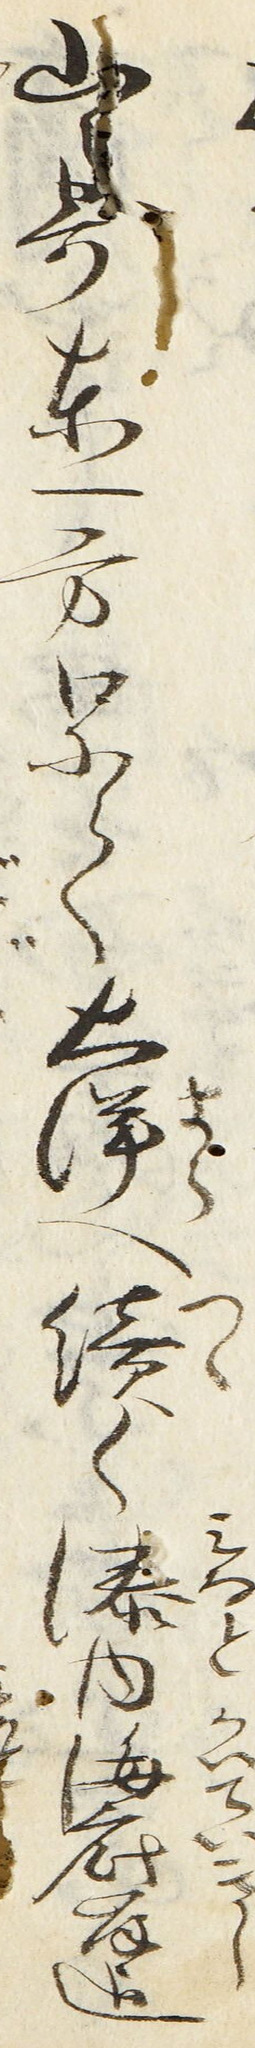山に寄東一方口にて大洋へ続く湊内海底岸迄
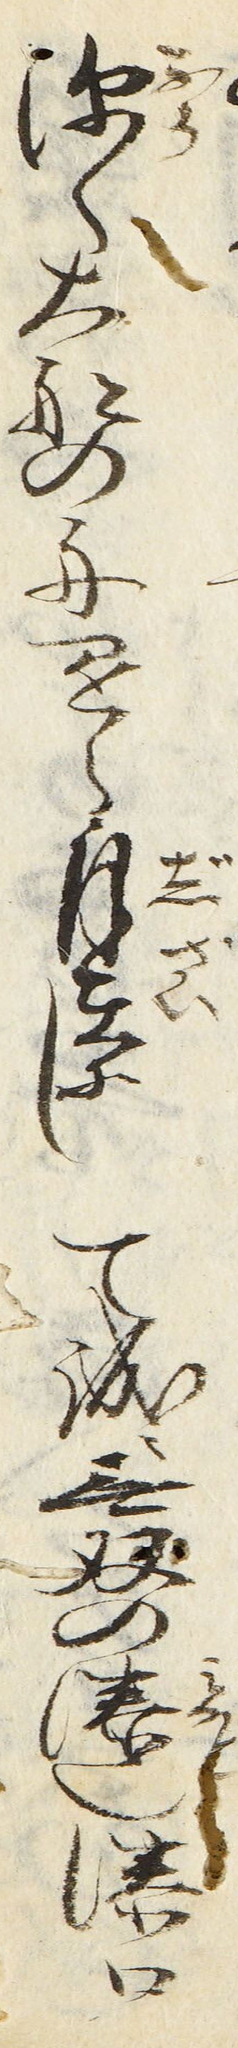深く大船の舟懸之自在にして誠に無双の湊也湊口

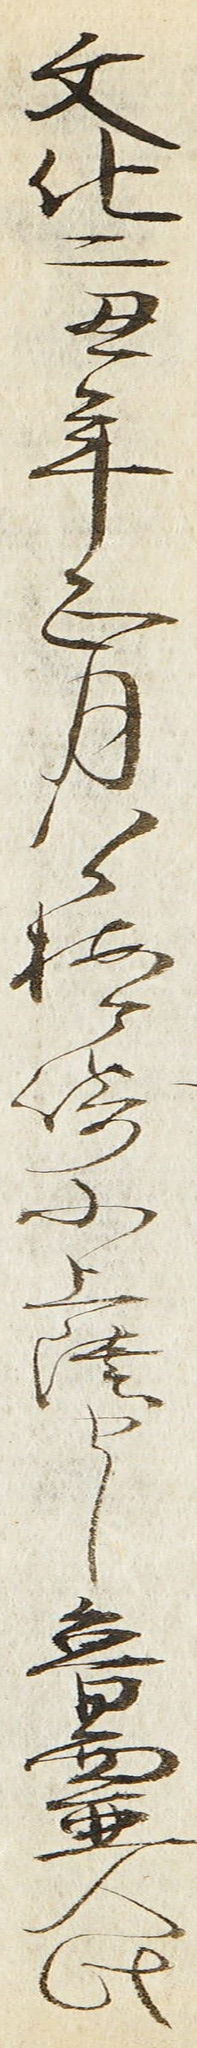文化二丑年正月八日梅ヶ崎に上陸せし魯西亜人此
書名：魯西亜国舟渡来始末并日本流漂人異国遍歴之話（西洋欧羅巴州之内一）
